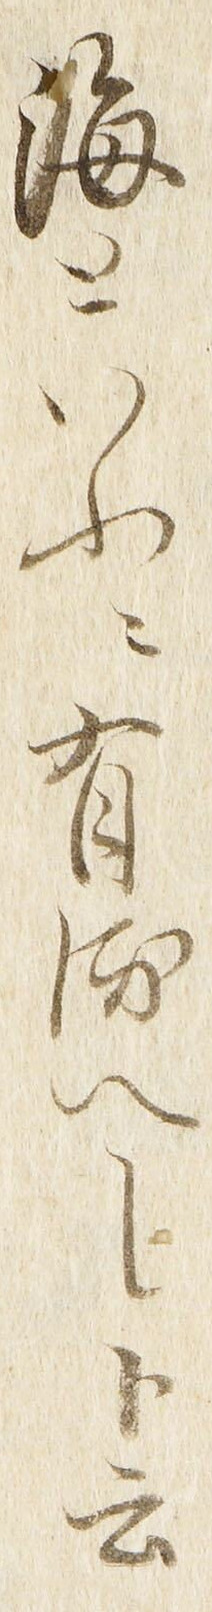海といふに有るへしと云
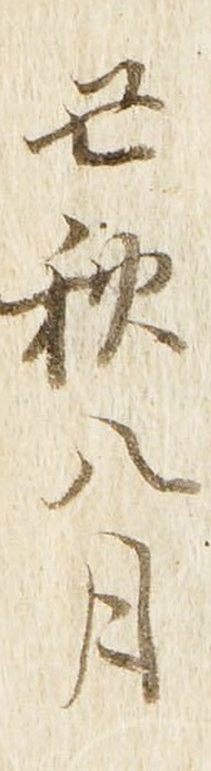丑秋八月

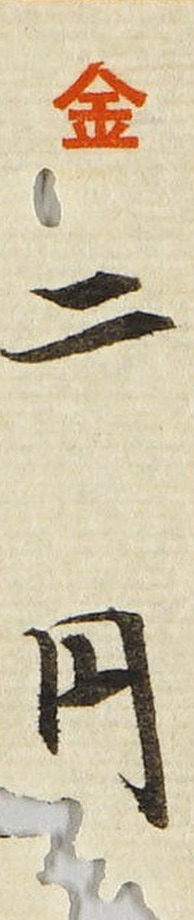金弐円
